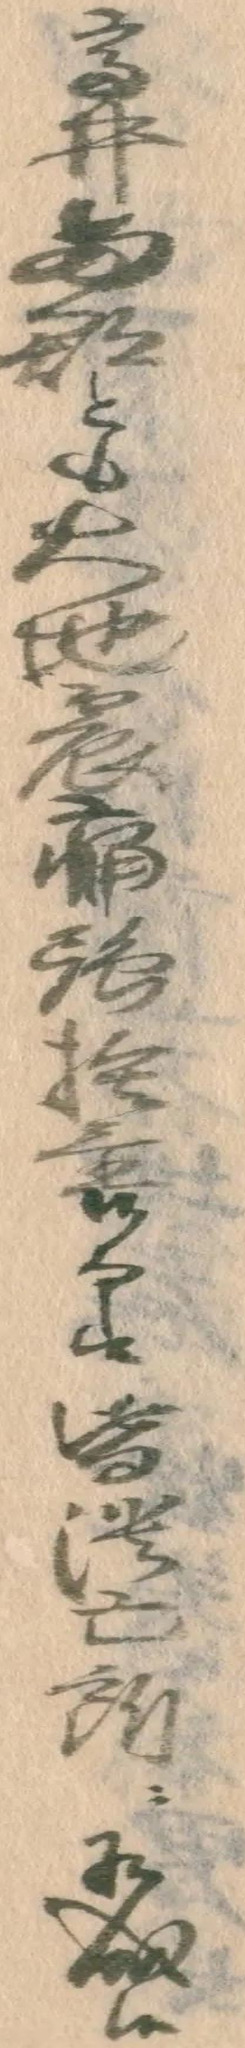高井両郡共大地震痛強捨置候てハ皆潰亡所ニ相成候
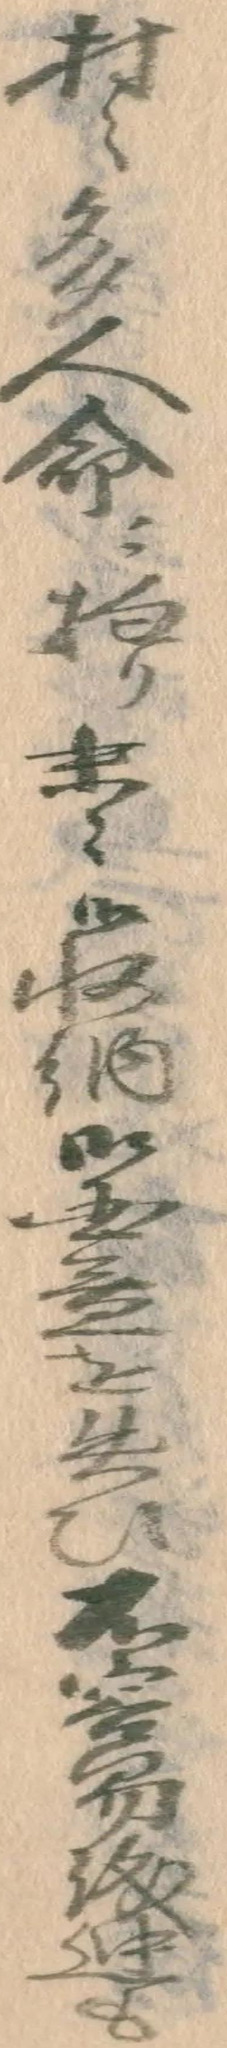村々多人命ニ拘り末々御収納御国益を失ひ不容易儀迚も
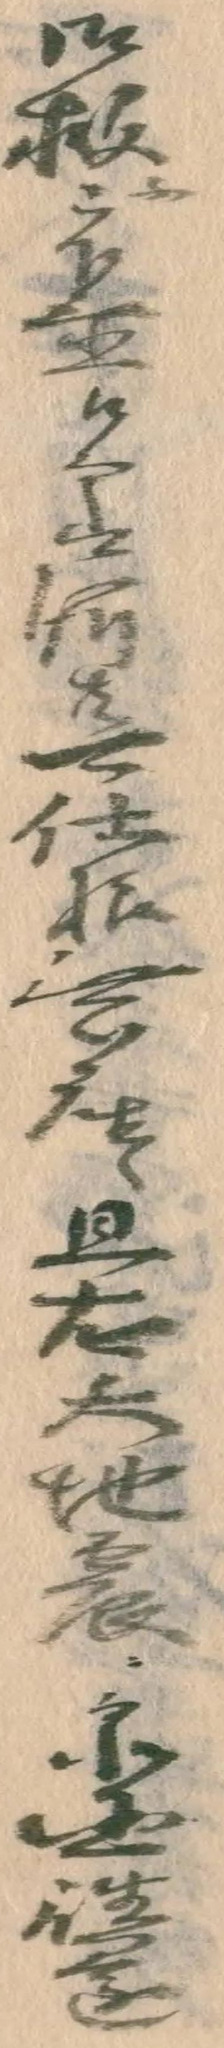御救不被下置候而は何共可仕様無御座候且右地震ニ而北国往還
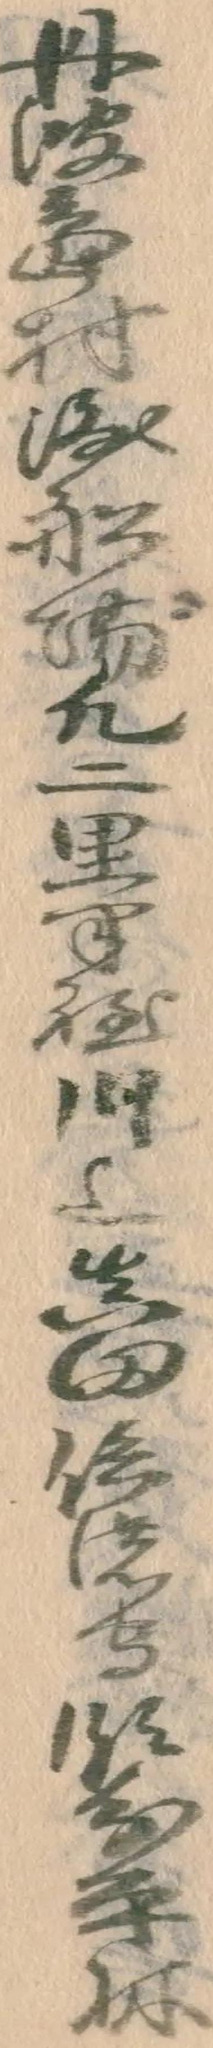丹波島村渡船場凡弐里半程川上真田信濃守領分平林
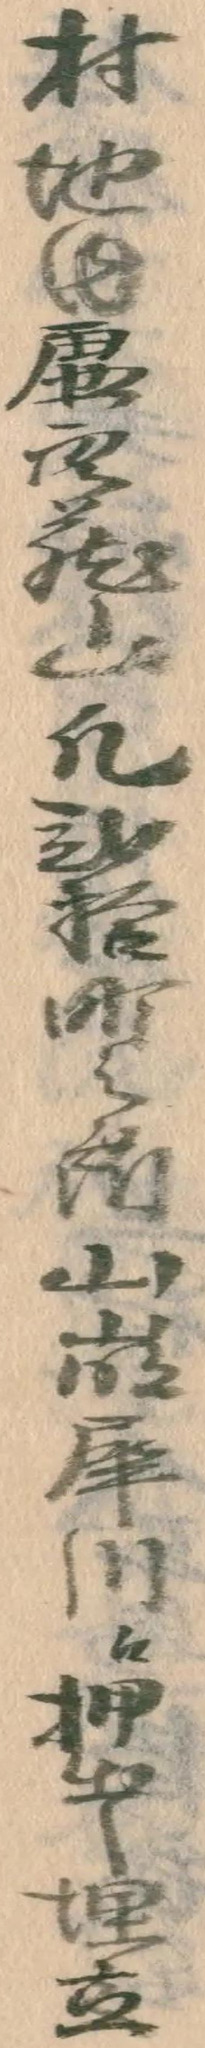村地内虚空蔵山凡弐拾丁之所山崩犀川江押出し埋立
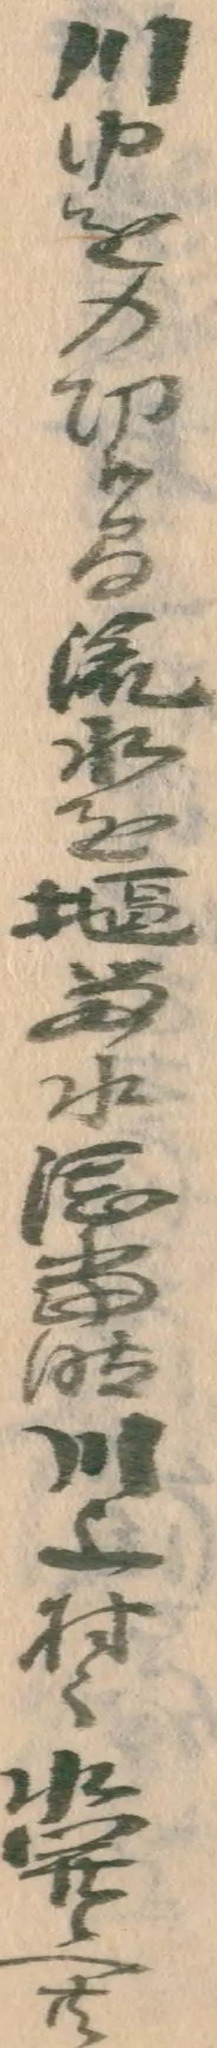川中ヲ〆切候間流水ヲ堰留水湛当時川上村々水開候へ共
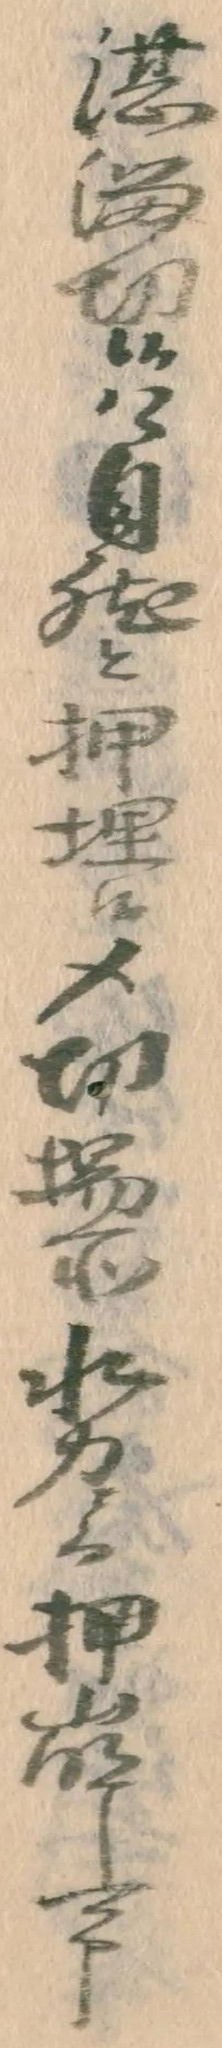湛溜切候ハヽ自然と押埋候〆切場所水力ニ而押崩し可申
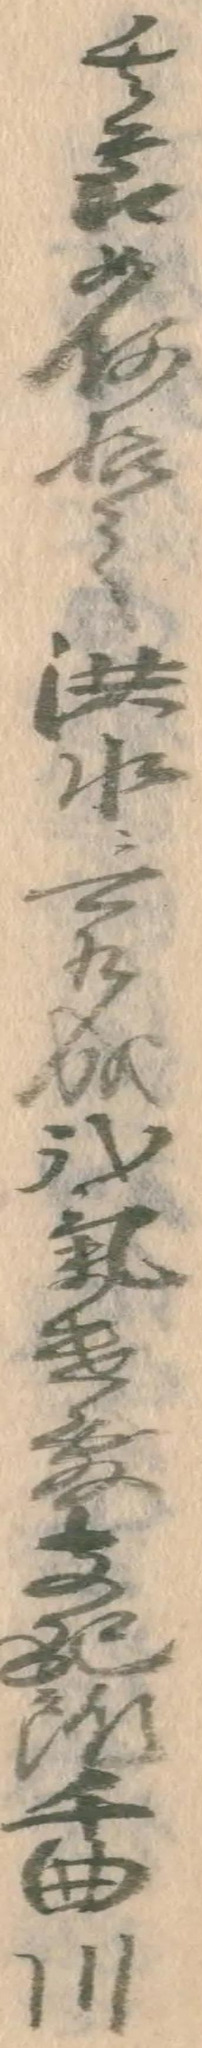其節如何様之洪水ニ可相成哉気遣敷支配所千曲川
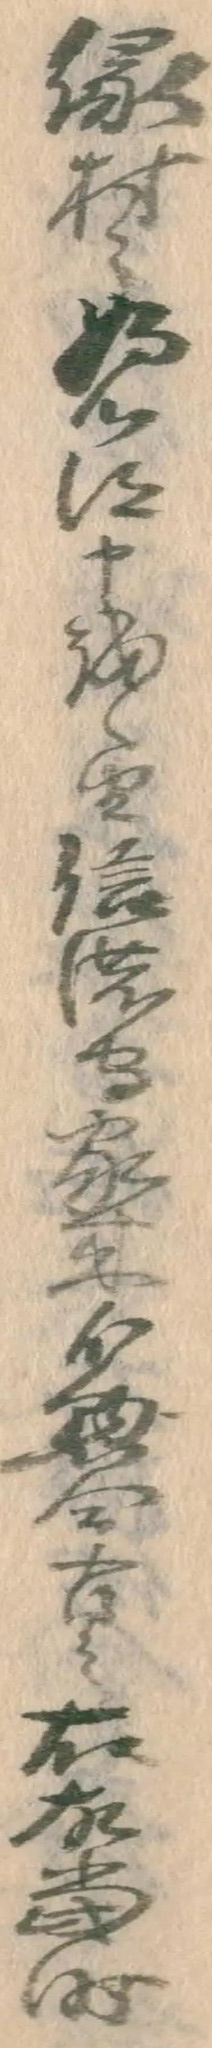縁村々為心得申越候由信濃守家来ゟ懸合有之右故当時
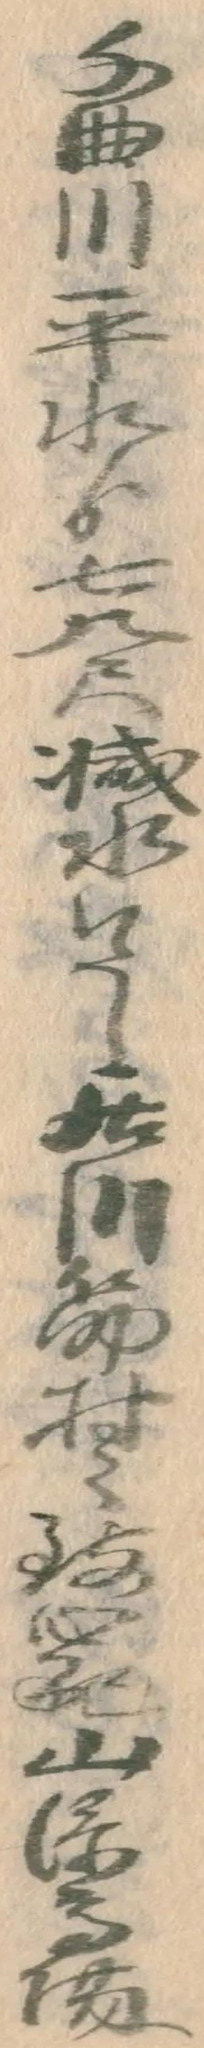千曲川平水ゟ七八尺減水いたし居川筋村々致心配山添高場
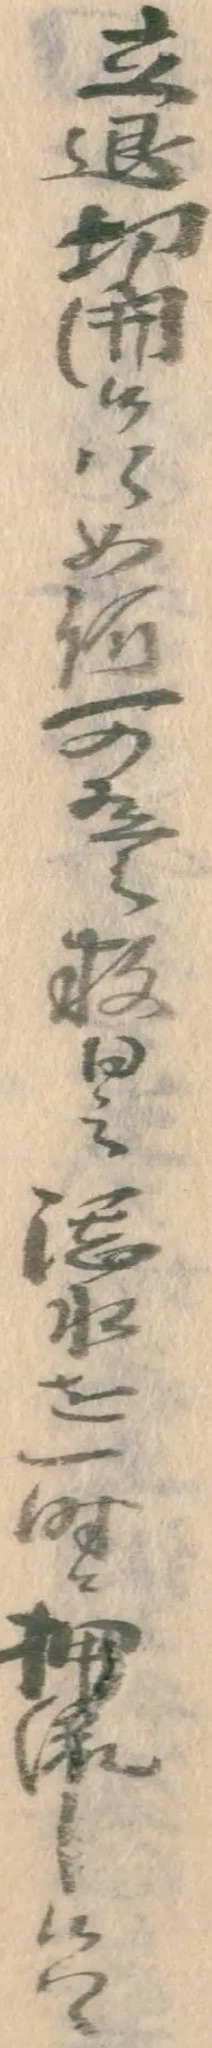立退切開候ハヽ如何可有之数日之泥水を一時二押流し候ハゝ
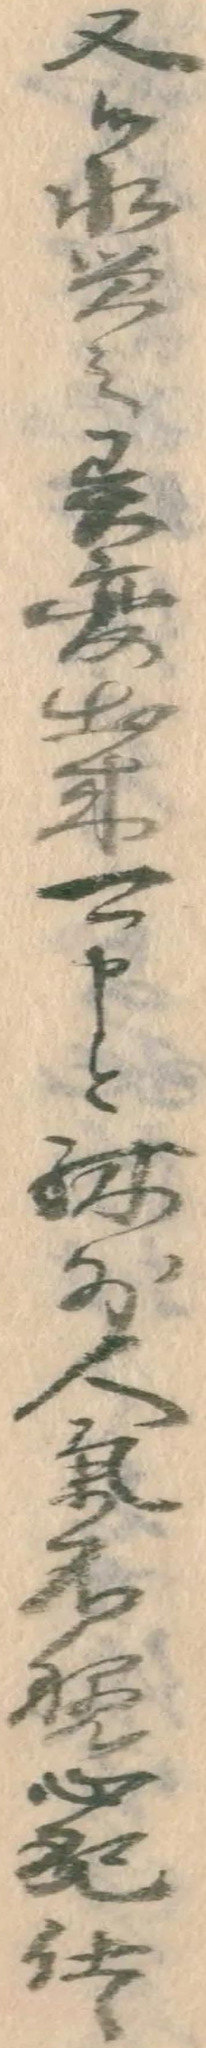又候水災之異変出来可申と殊外人気不穏心配仕候
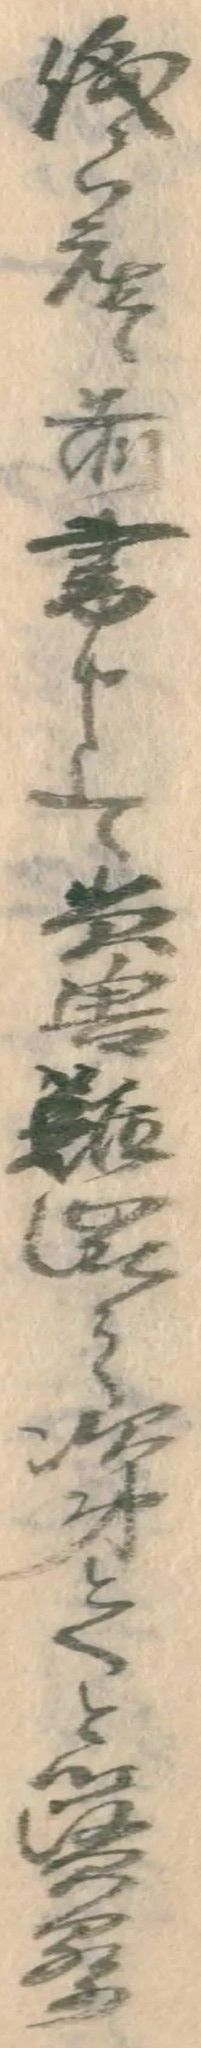儀ニ御座候前書申上候災害難渋之次第とくと御賢察
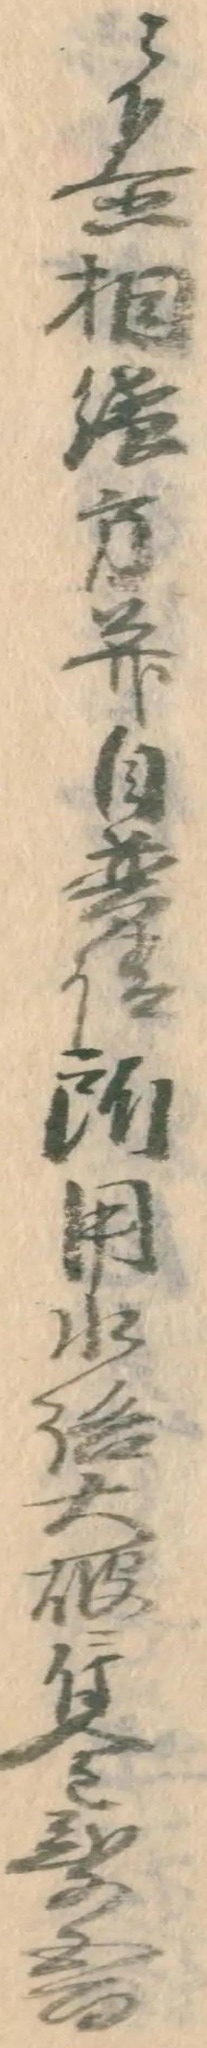被下置相続方并自普請之所用水路大破ニ付金弐千五百

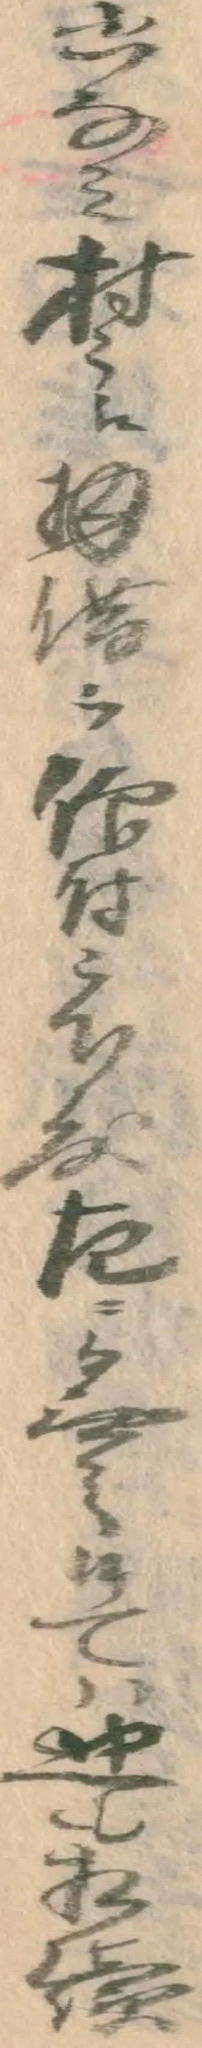書面之村々江拝借被仰付被下度左二而無之候てハ迚も相続
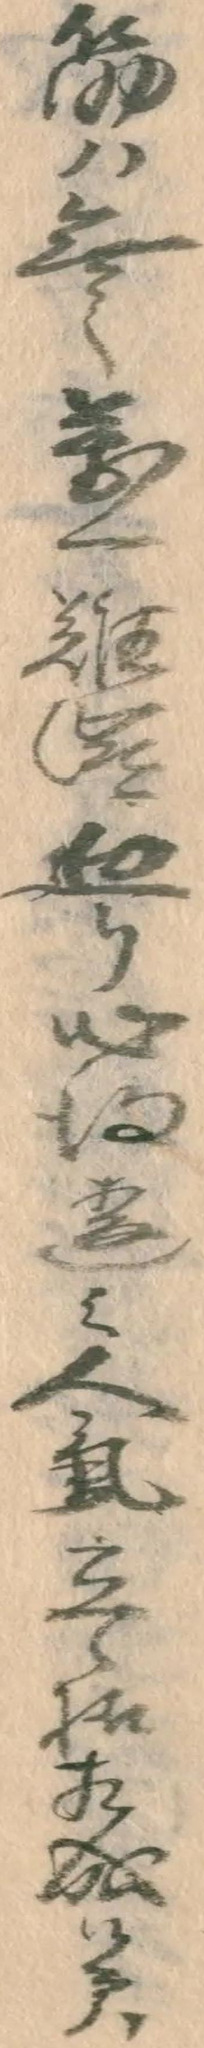筋ハ無之万一此上難渋迫り且心得違之人気立候様成候而ハ
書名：信州大地震之記
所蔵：国立国会図書館 National Diet Library, JAPAN
